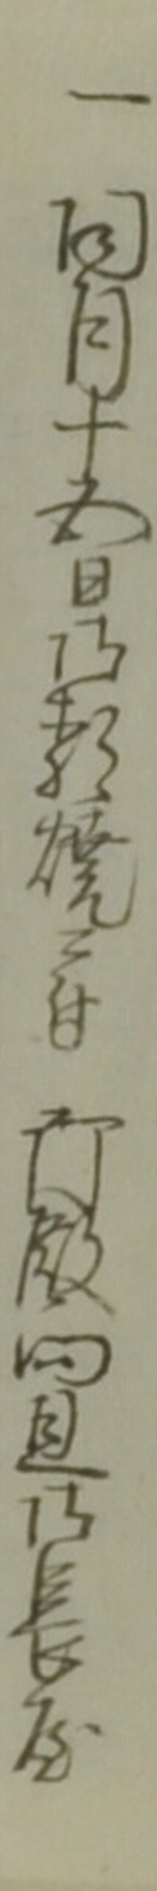一同月十五日御類焼ニ付御殿向且御長屋
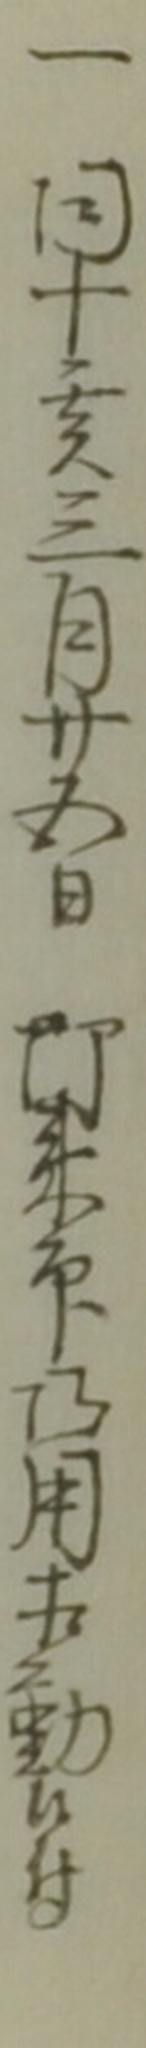一同十亥年三月廿五日御朱印御用相勤候付
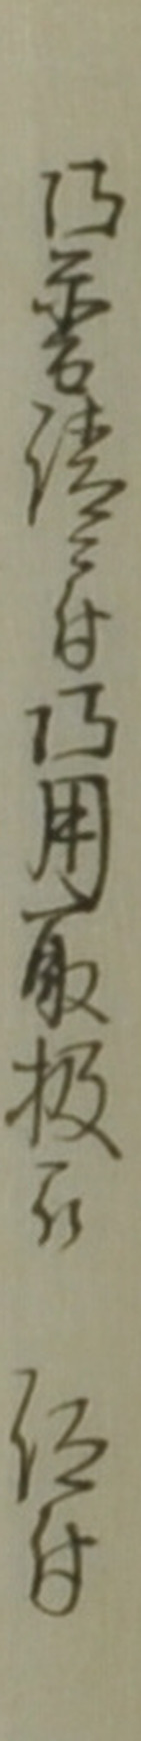御普請ニ付御用取扱被仰付
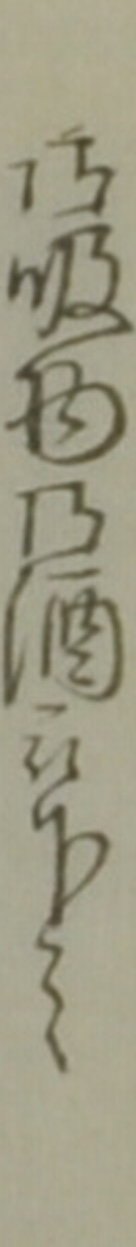御吸物御酒被下之
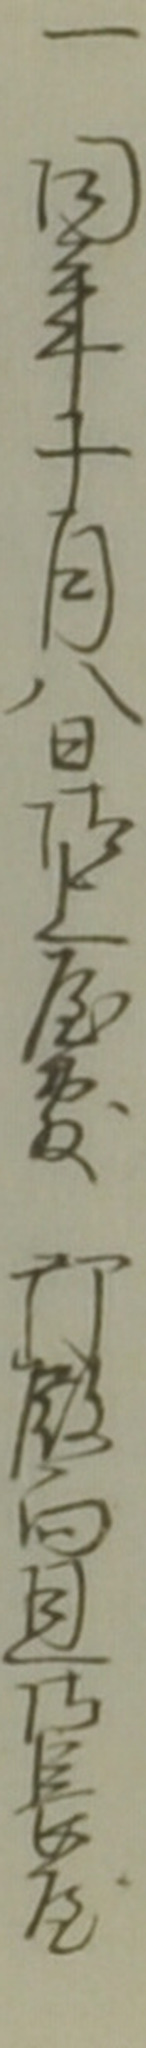一同年十月八日御上屋敷御殿向御長屋
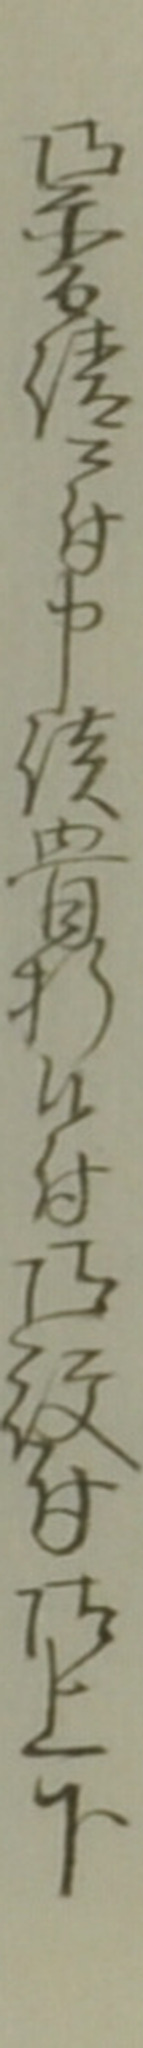御普請ニ付申談骨折候付御紋付御上下
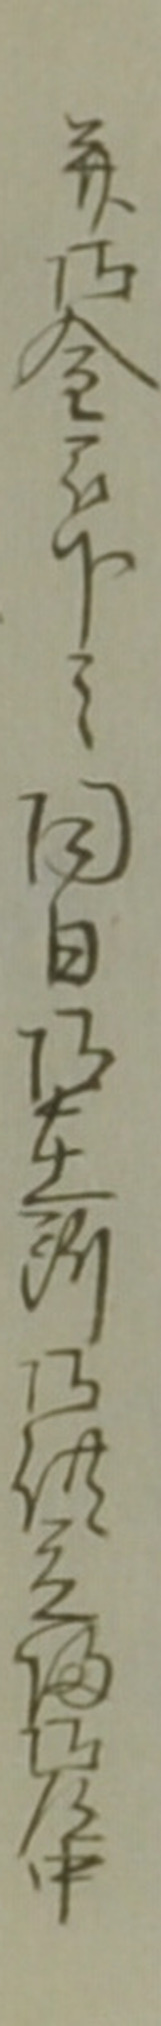并御金被下之同日御在所御供立帰御道中
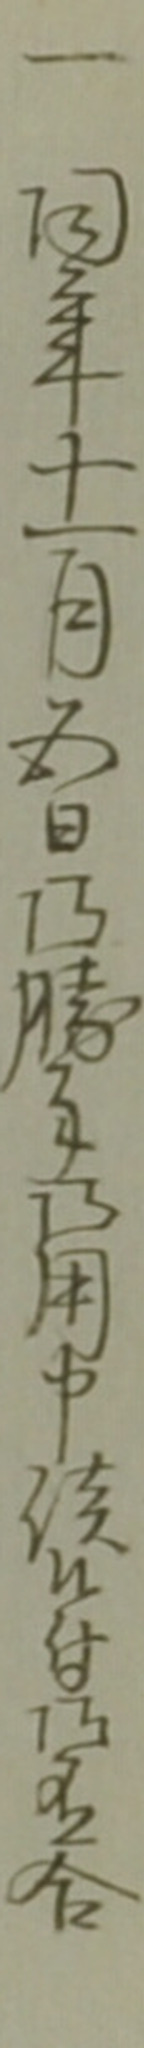一同年十一月五日御勝手御用申談候付御有合

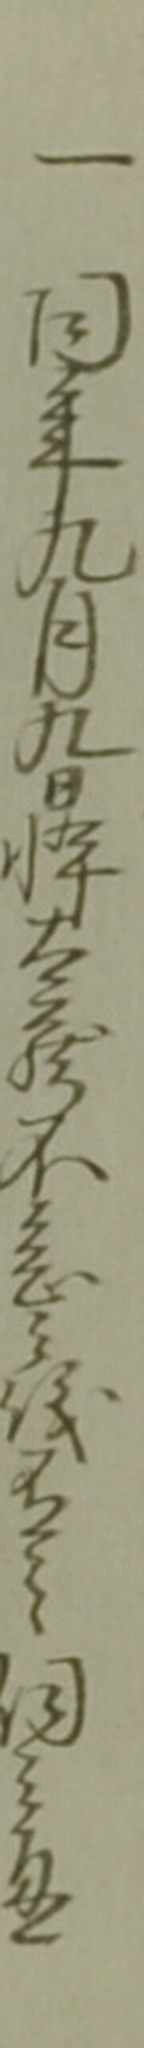一同年九月九日忰太蔵不念之儀有之伺之通
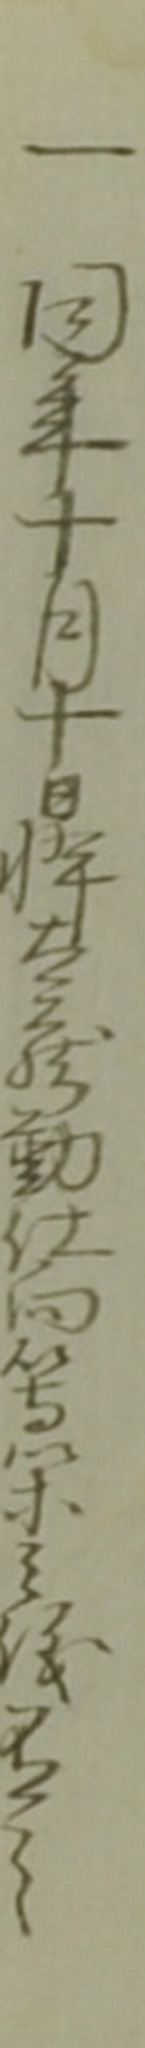一同年十月十日忰太蔵勤仕向等閑之儀有之
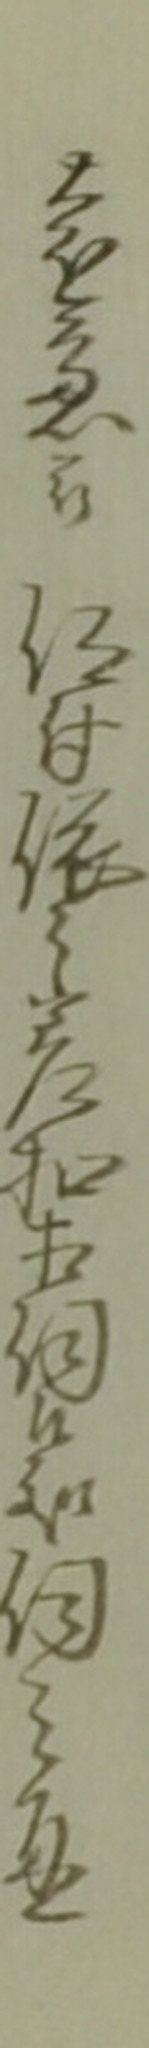遠慮被仰付依之差控相伺候処伺之通
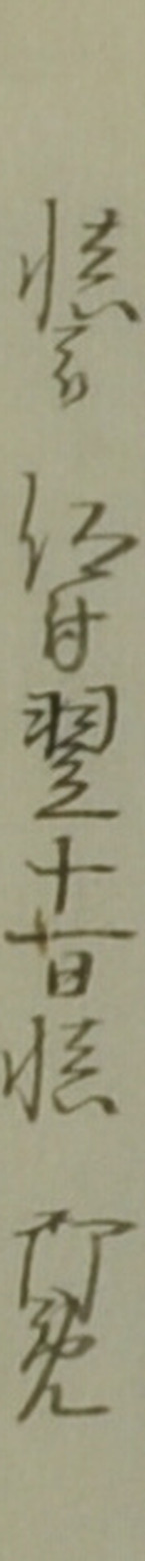慎被仰付翌十一日慎御免
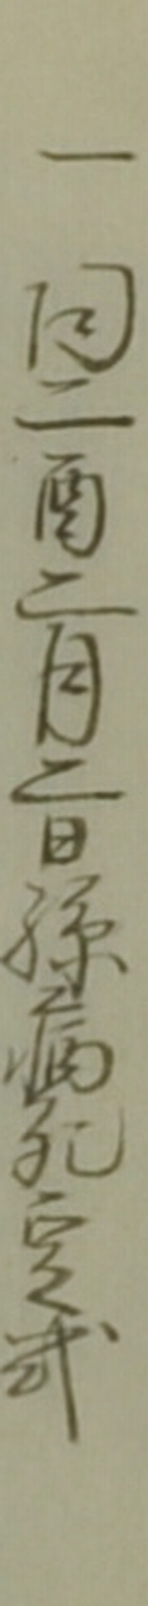一同二酉二月二日孫病死定式
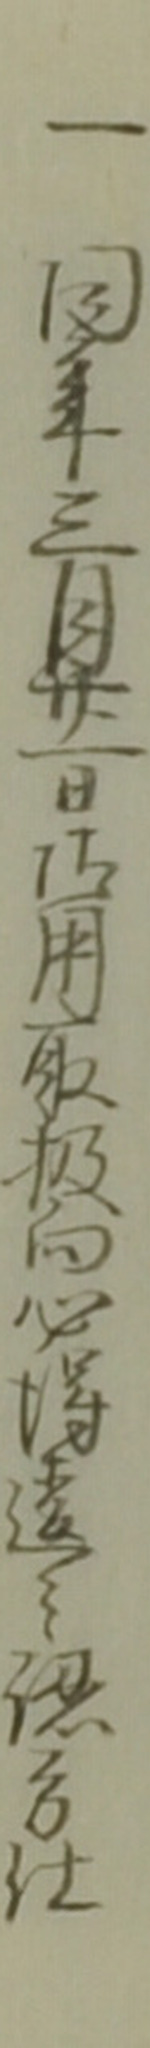一同年三月廿一日御用取扱向心得違之認方仕
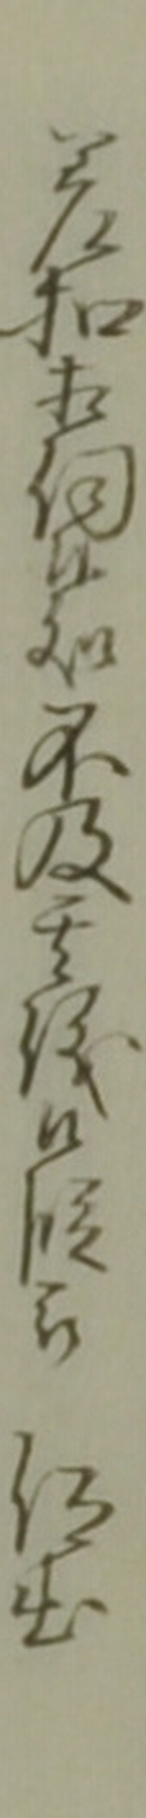差控相伺候処不及其儀候段被仰出
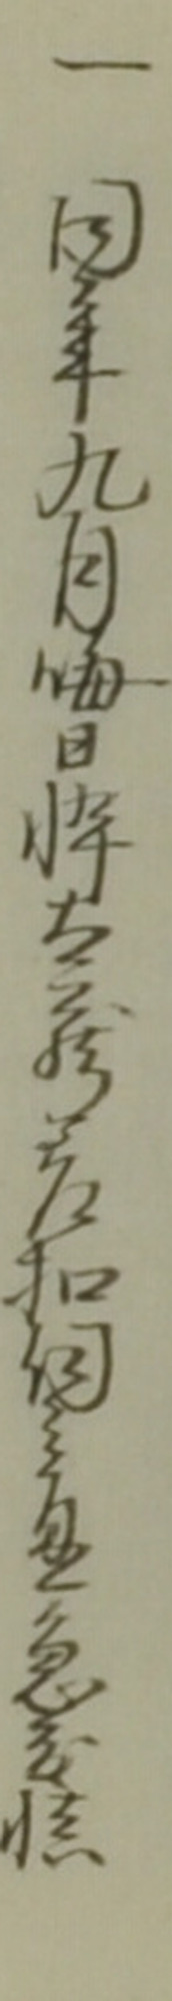一同年九月晦日忰太蔵差控伺之通急度慎
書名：給人諸士勤仕録（三）
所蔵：伊那市立高遠町図書館・合同会社AMANE
